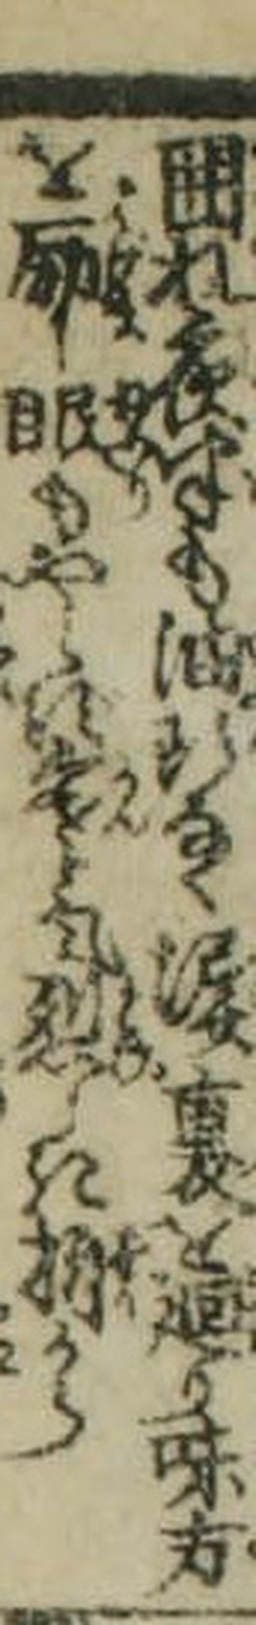を励し眠もやらず寒気烈しき折から
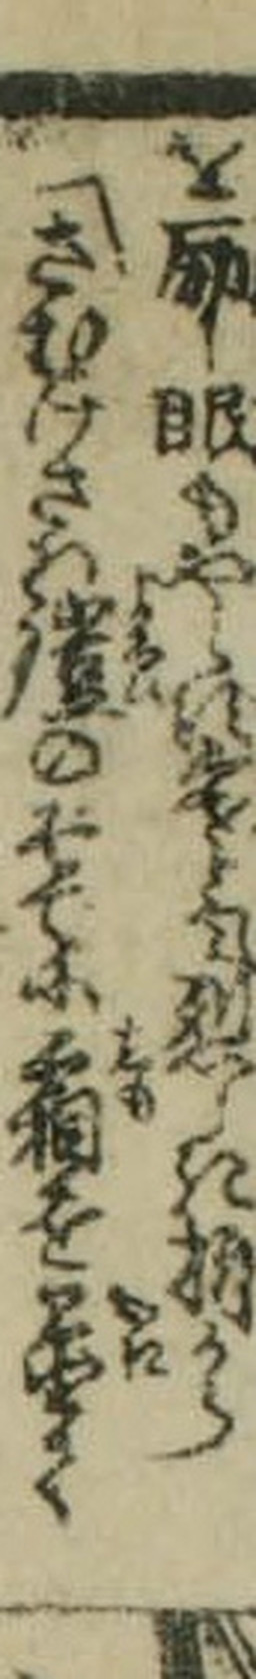〽さむけさは鎧のそてに霜を置て
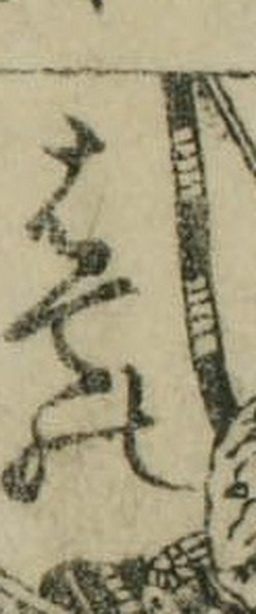はての
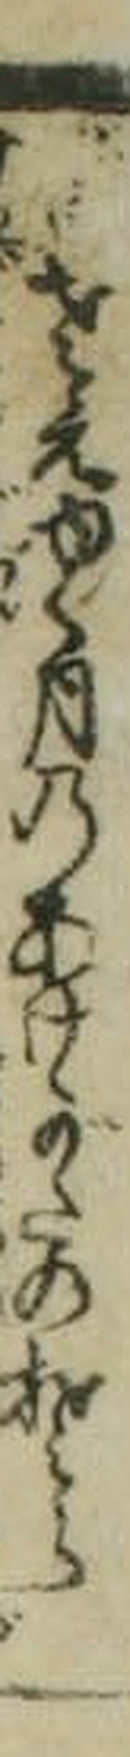さえゆく月のあけかたのそら
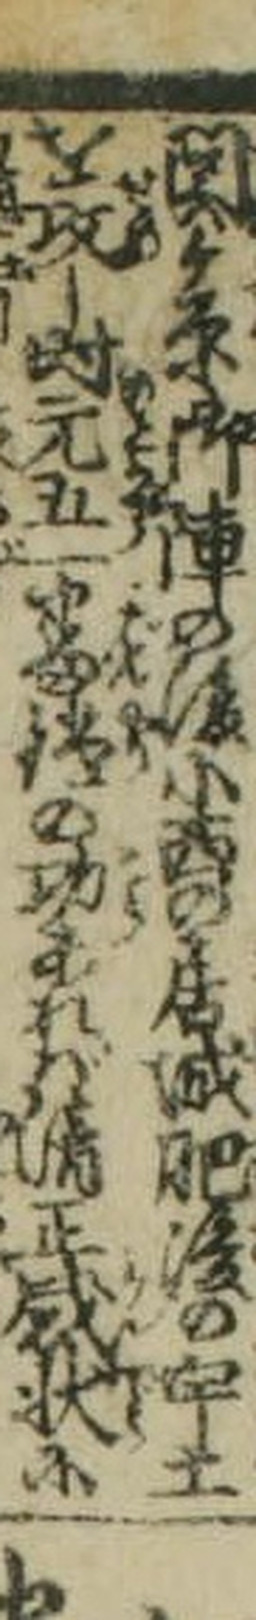を攻し時元五一番鑓の功あれば清正感状に
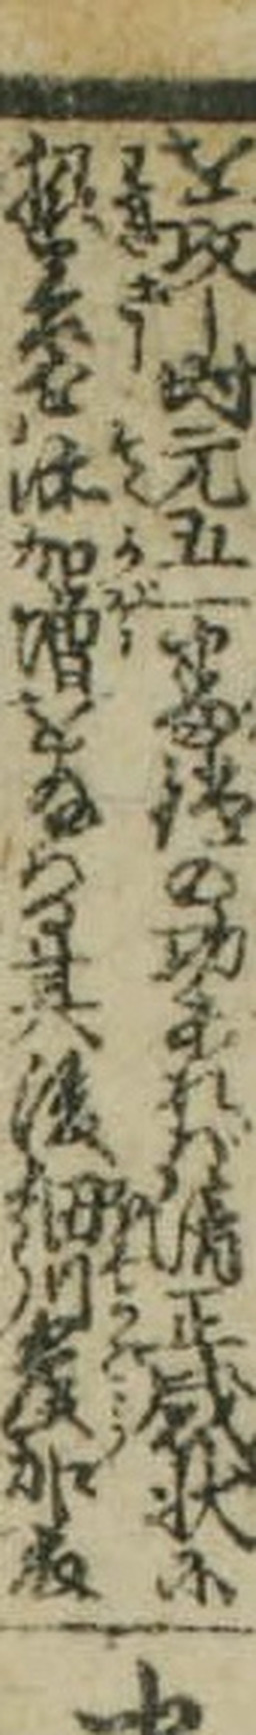脇差を添加増を給はる其後細川侯加藤
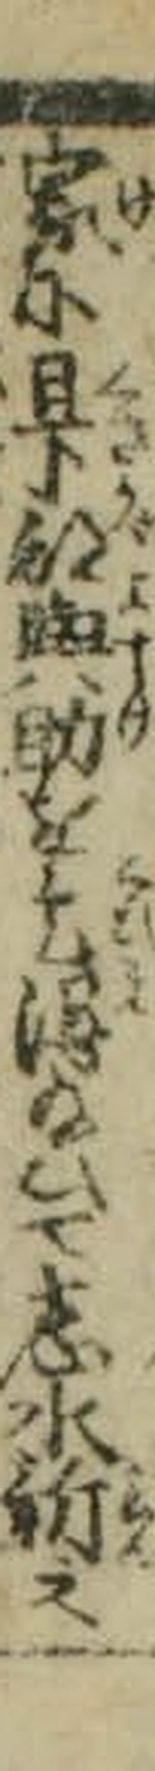家に日下部與助を乞得給ひて志水新之
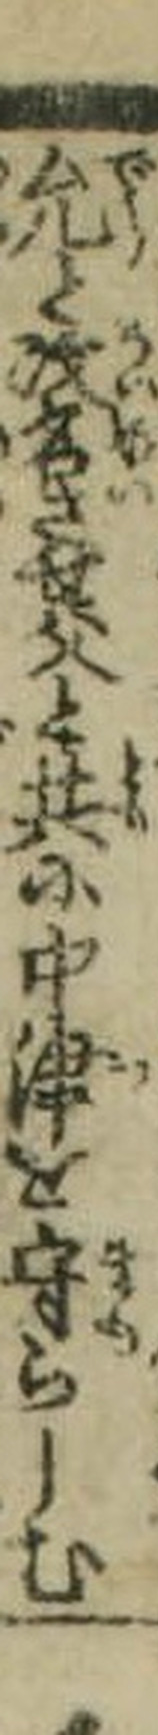允と改名させ父と共に中津を守らしむ
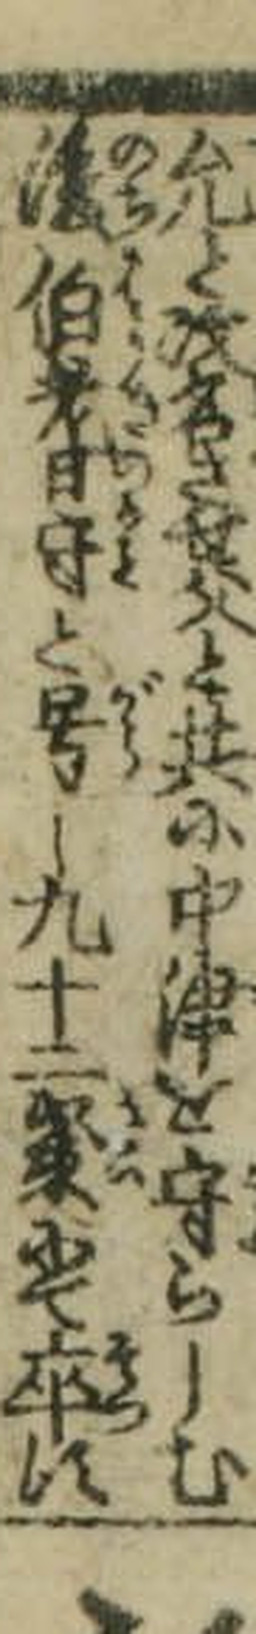後伯耆守と号し九十二歳にて卒す
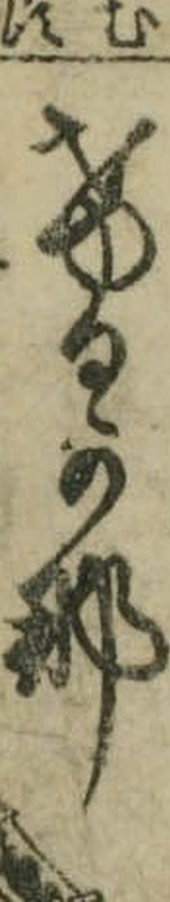けるかな
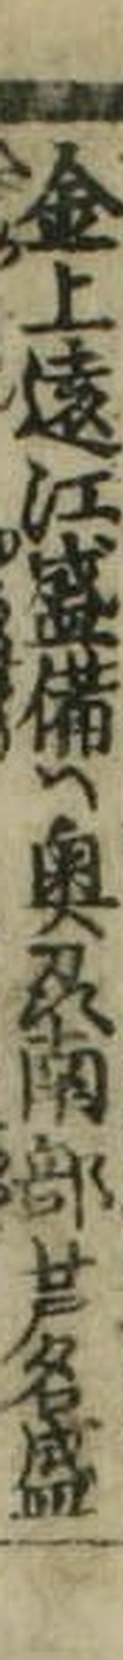金上遠江盛備は奥州南部芦名盛
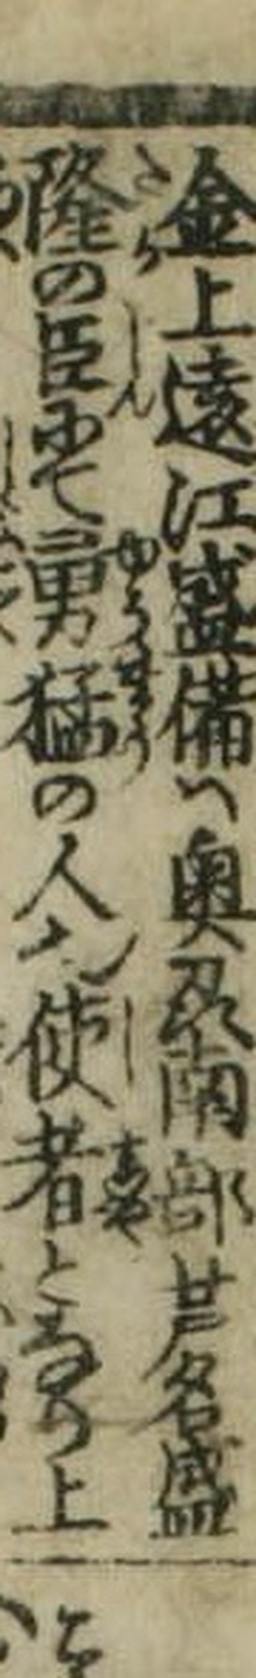隆の臣にて勇猛の人也使者となり上
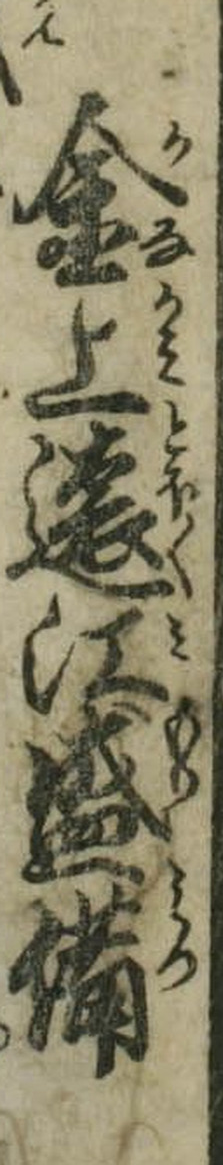金上遠江盛備
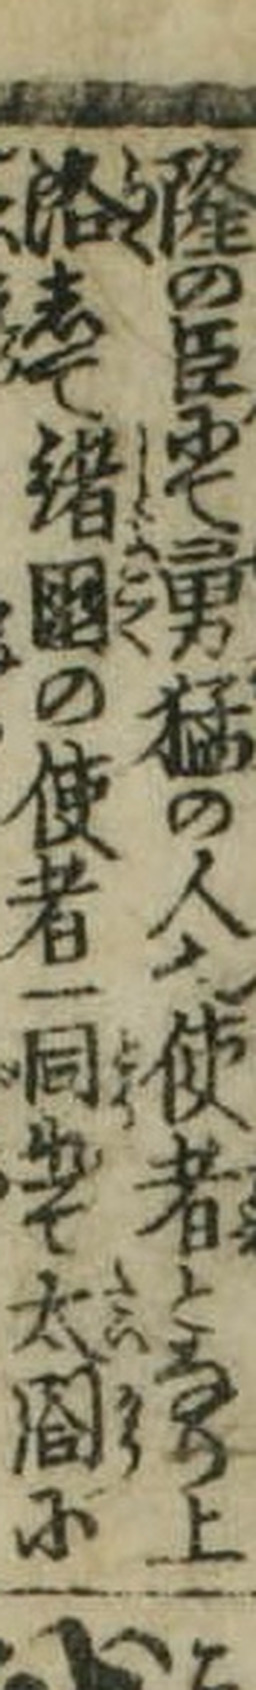洛して諸国の使者一同出て太閤に
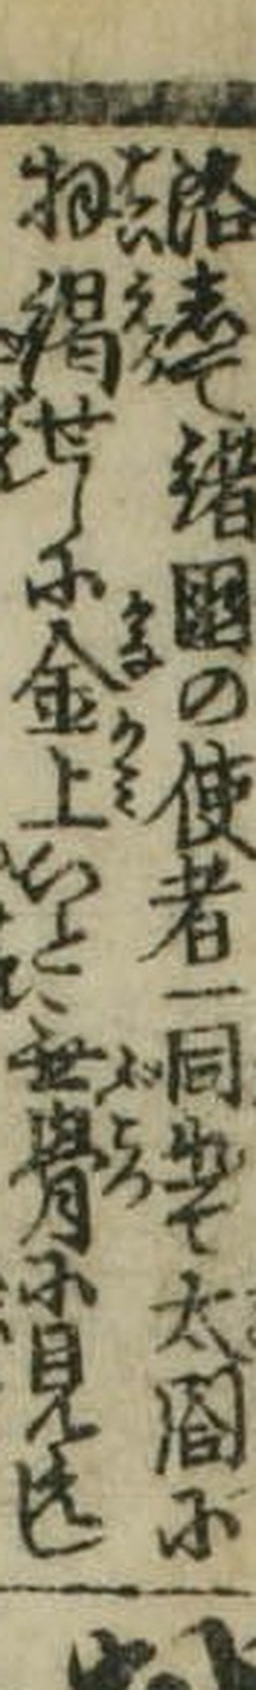拝謁せしに金上いと無骨に見えし
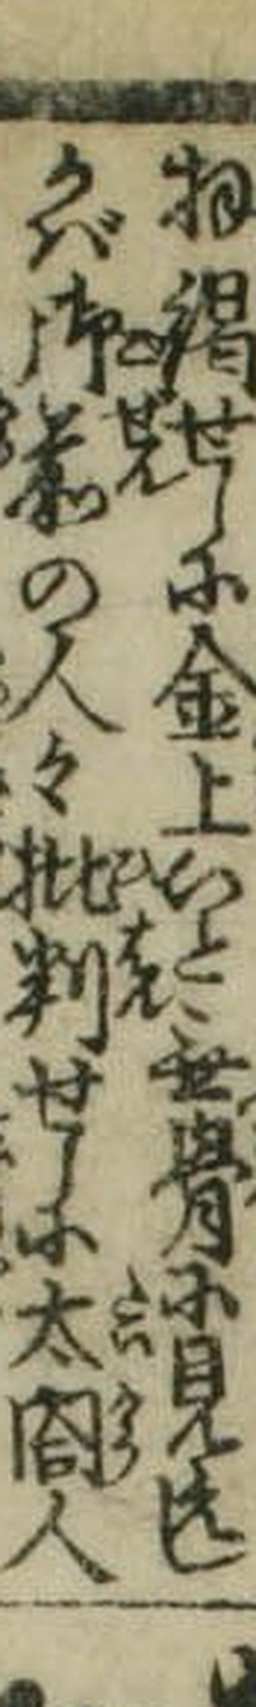かば御前の人々批判せしに太閤人
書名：續英雄百人一首
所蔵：東京学芸大学附属図書館
